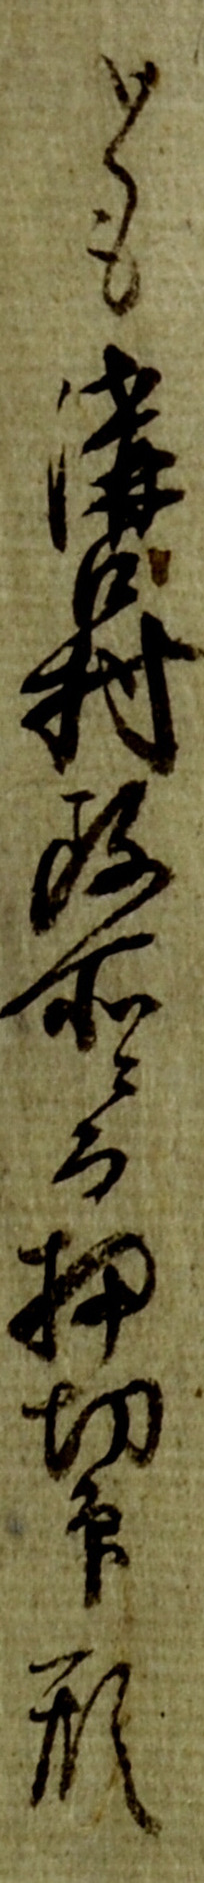とも溝口村改所ニ而押切印形
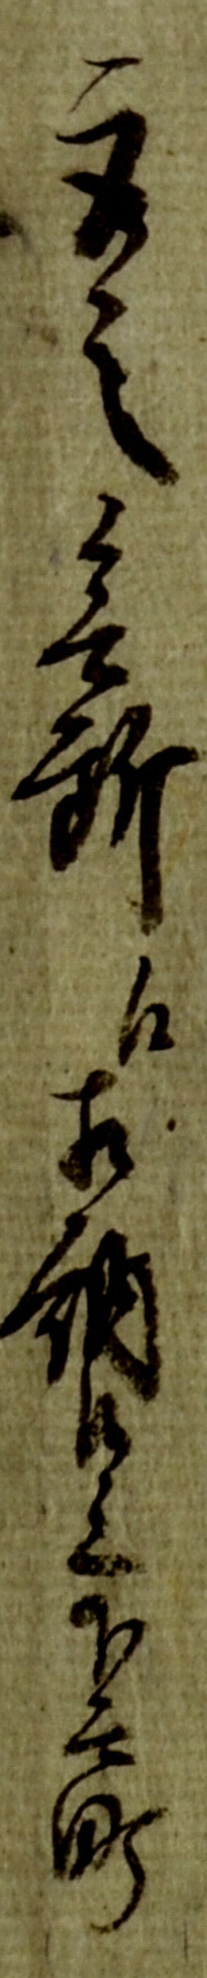有之会所江相納候上下モ町
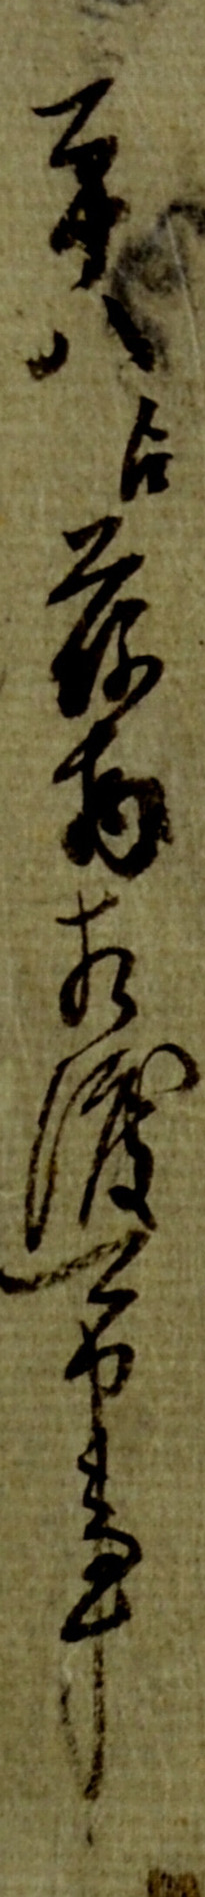平八江荷物相渡可申事

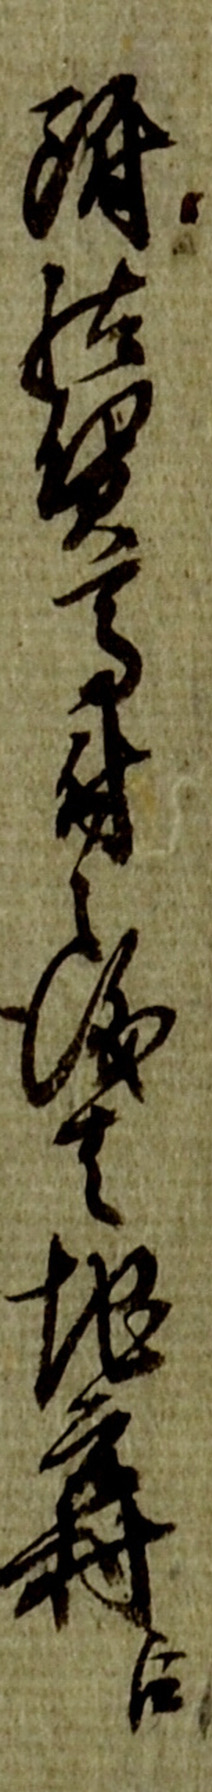附駄賃高付之儀者地元村江
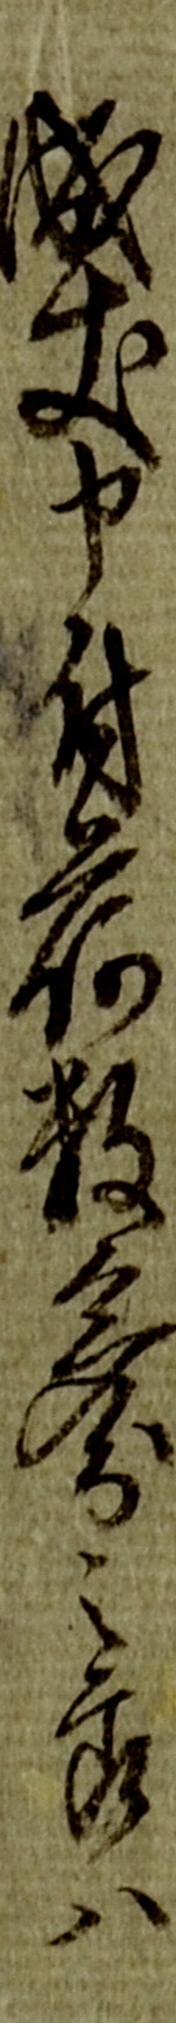成丈申付荷数多分之節ハ
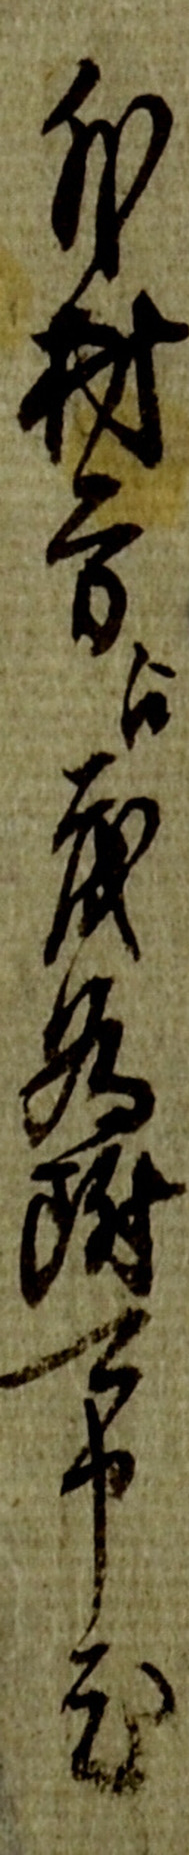外村方江茂為附可申出
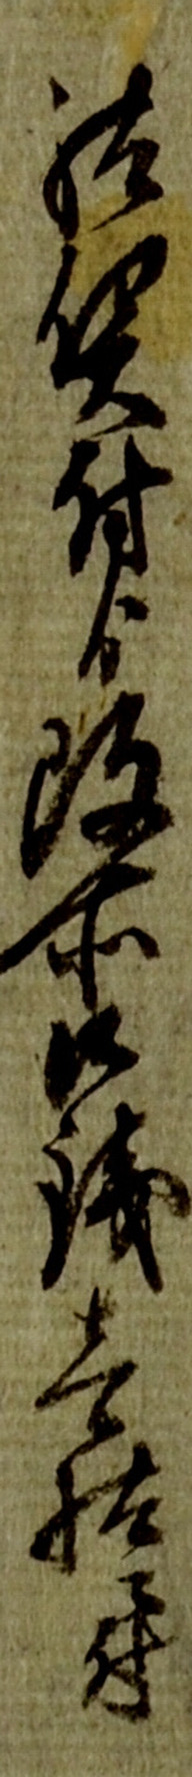駄賃付ゟ役所口銭壱駄ニ付
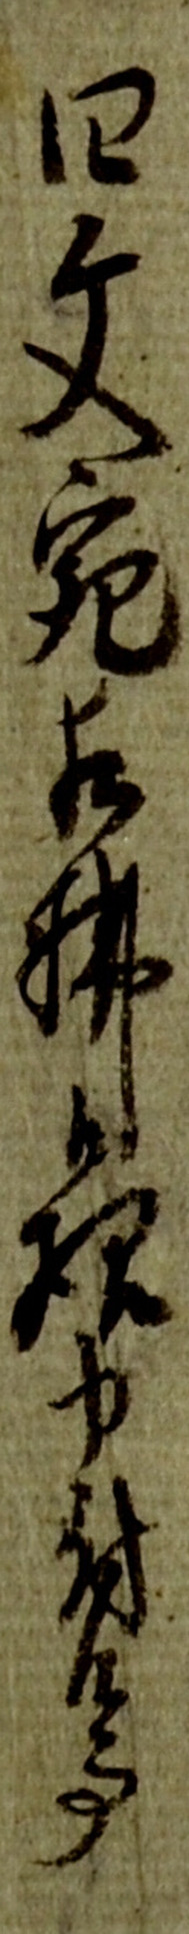四文宛相払候様申付候事
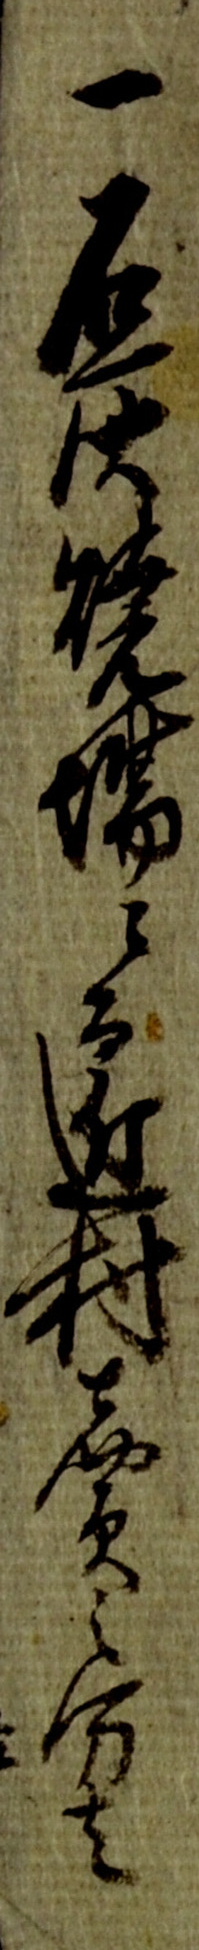一石灰焼場ニ而近村売之分者
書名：覚
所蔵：伊那市立高遠町図書館・合同会社AMANE
